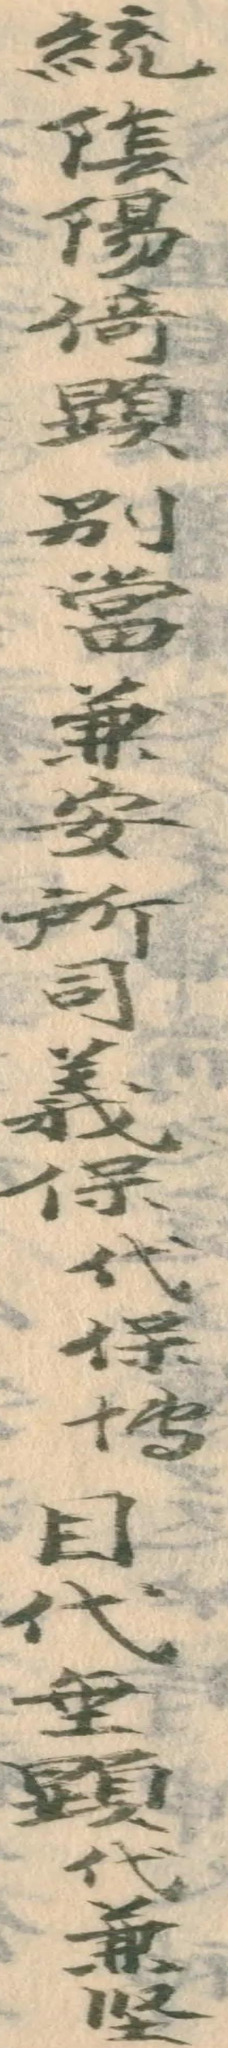統陰陽倚顕別当兼安所司義保代保博目代垂顕代兼堅
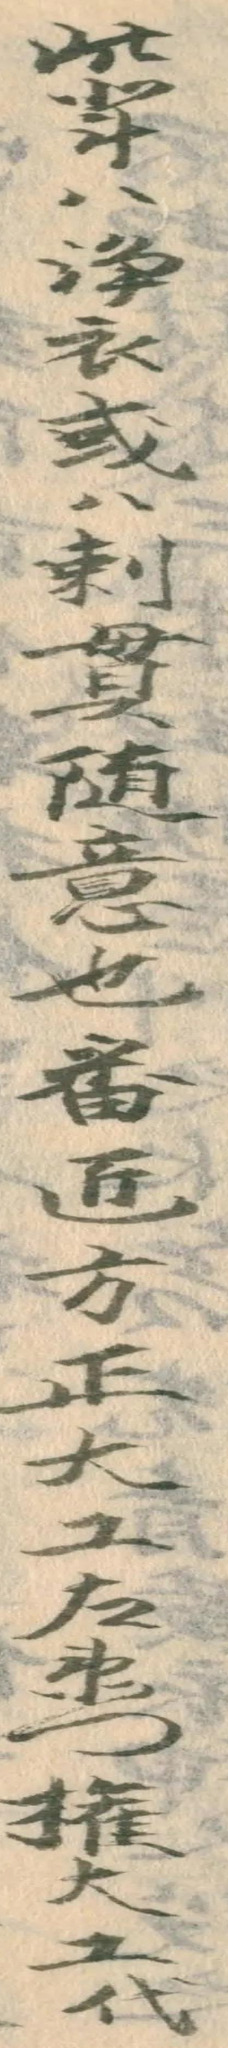此輩ハ浄衣或ハ刺貫随意也番匠方正大工左衛門権大工代
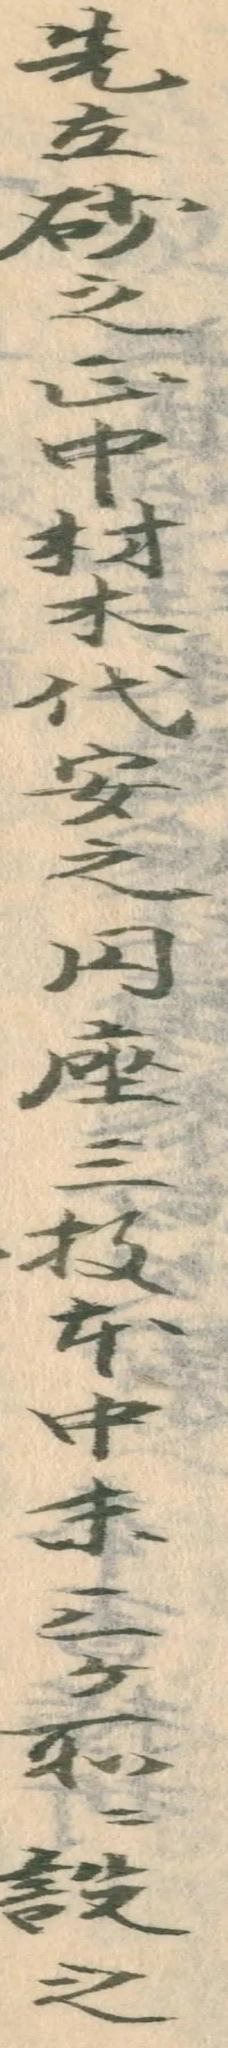先立砂之正中材木代安之円座三枚本中末三ヶ所ニ設之

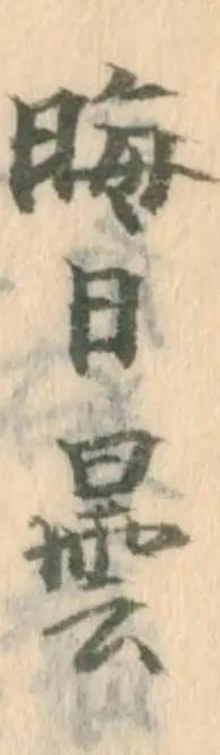晦日曇
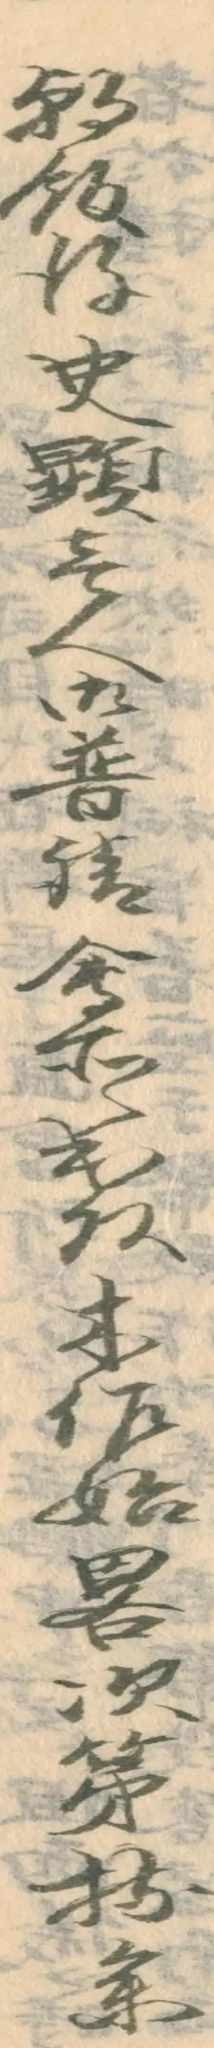一朝飯後史顕壱人御普請会所へ出頭木作始略次第持参
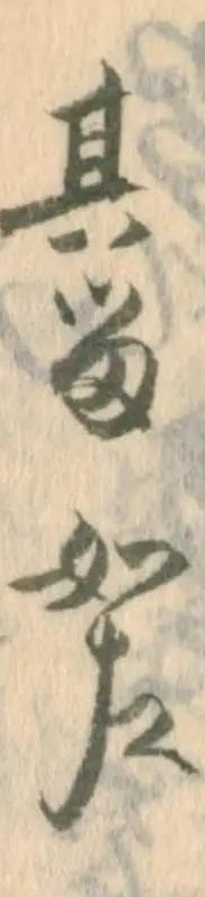其留如左
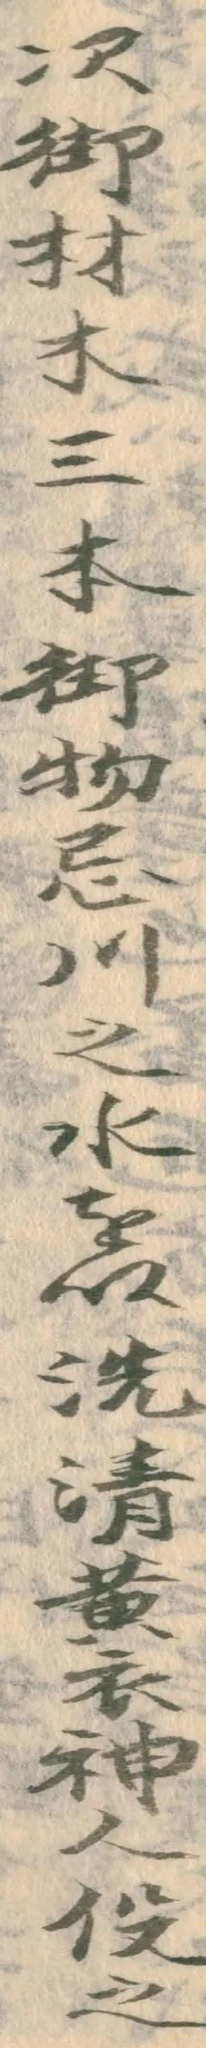次御材木三本御物忌川之水を以洗清黄衣神人役之
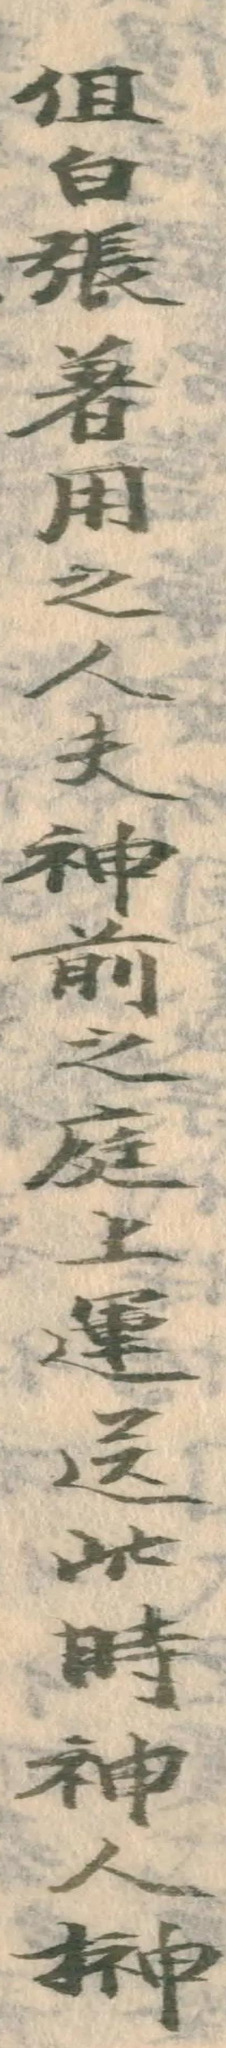但白張着用之人夫神前之庭上運送此時神人榊
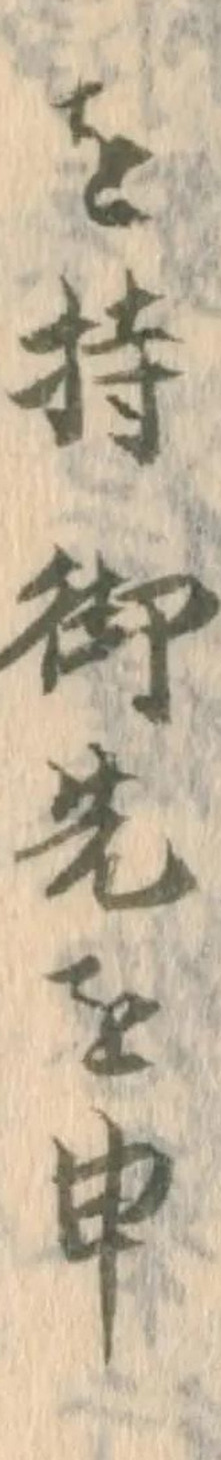を持御先を申
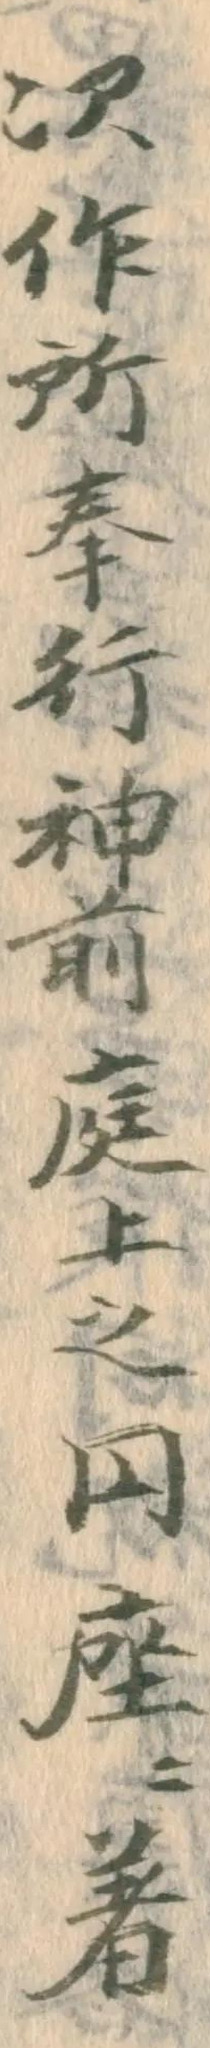次作所奉行神前庭上之円座ニ着
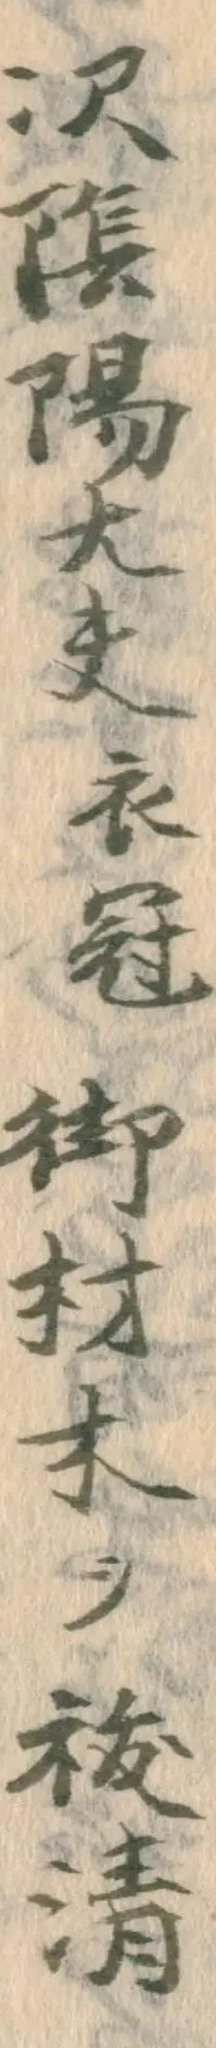次陰陽大夫衣冠御材木ヲ祓清
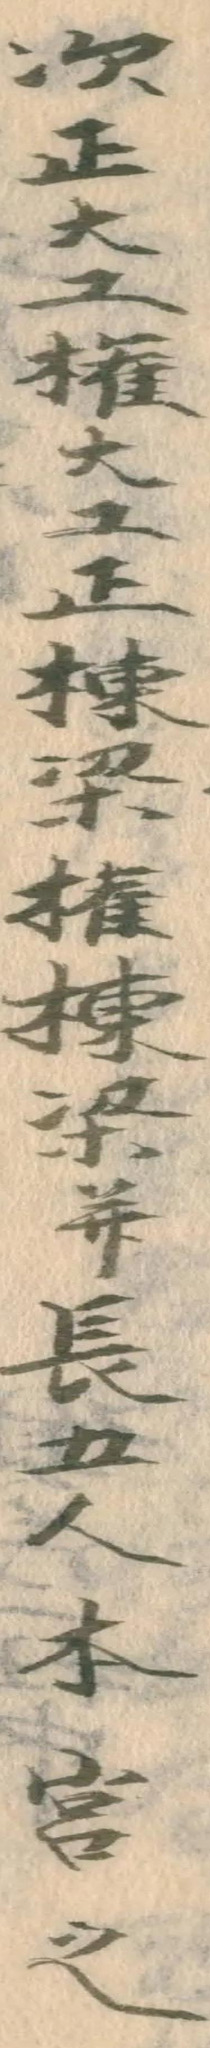次正大工権大工正棟梁権棟梁并長五人本宮之
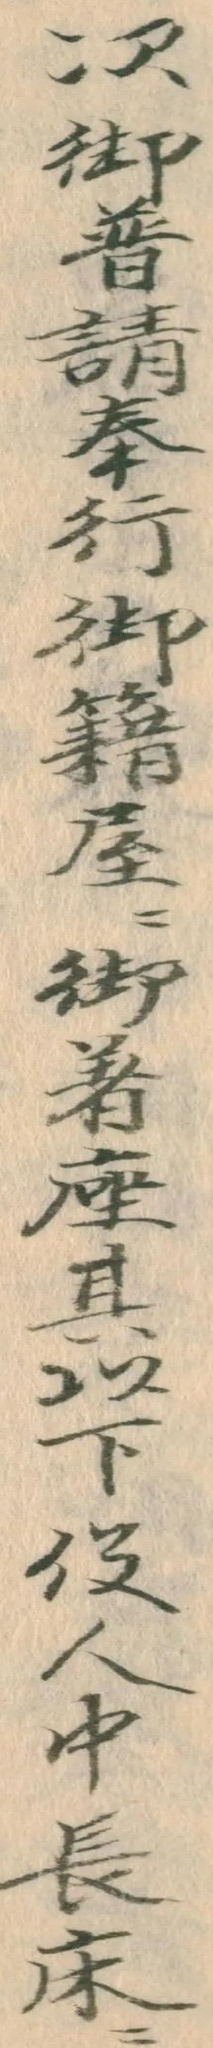次御普請奉行御籍屋ニ御着座其以下役人中長床ニ
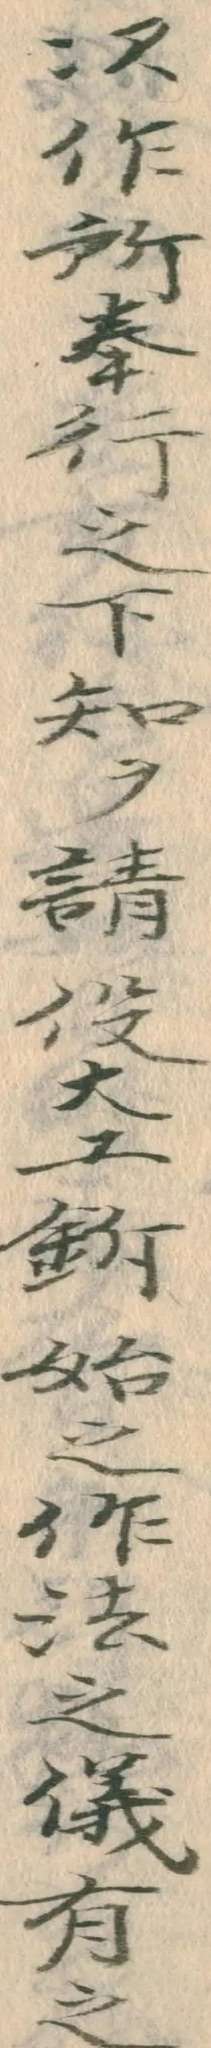以作所奉行之下知ヲ請役大工釿始之作法之儀有之
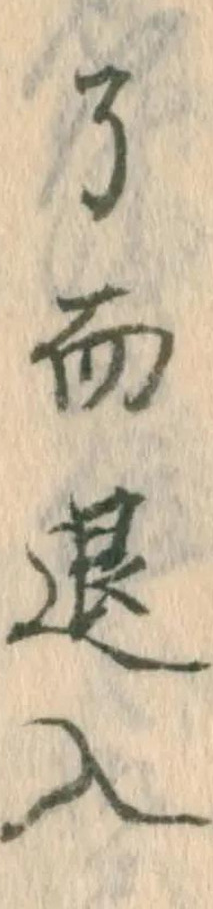了而退入
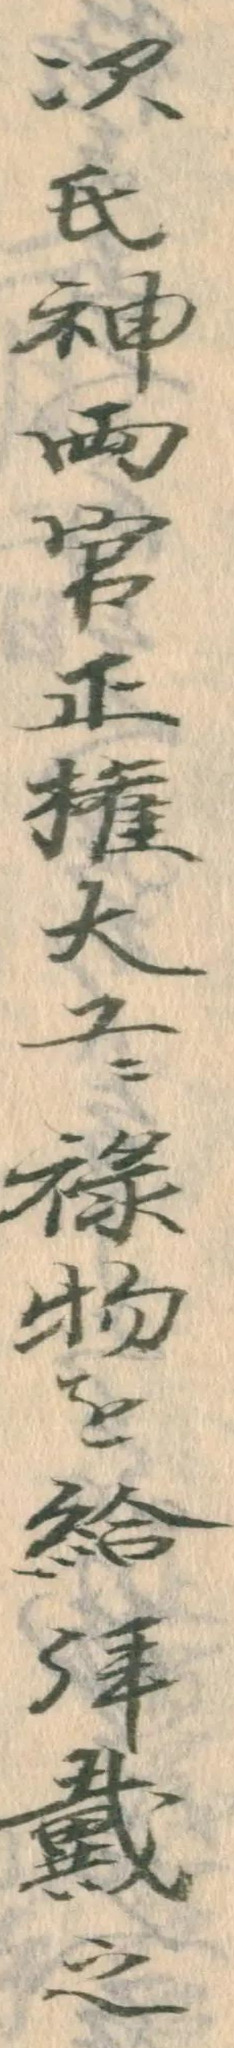次氏神両官正権大工ニ禄物を給拝戴之
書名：賀茂社記録. 第17冊
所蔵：国立国会図書館 National Diet Library, JAPAN
